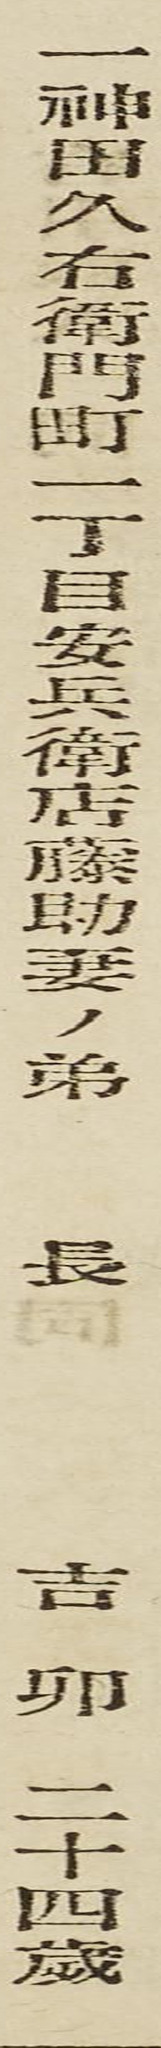一神田久右衛門町一丁目安兵衛店藤助妻ノ弟長吉卯二十四歳
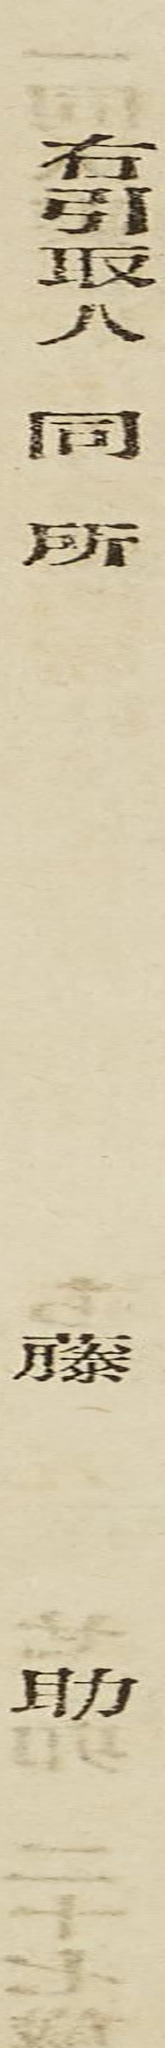右引取人同所藤助
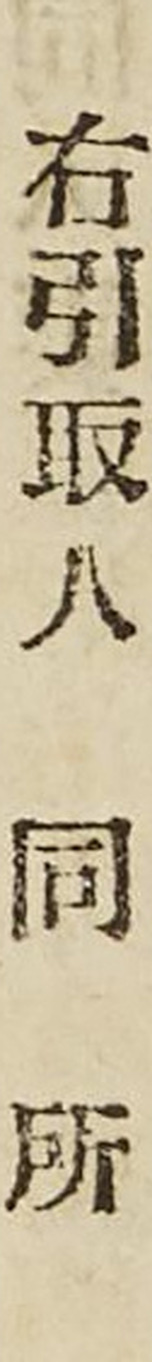右引取人同同
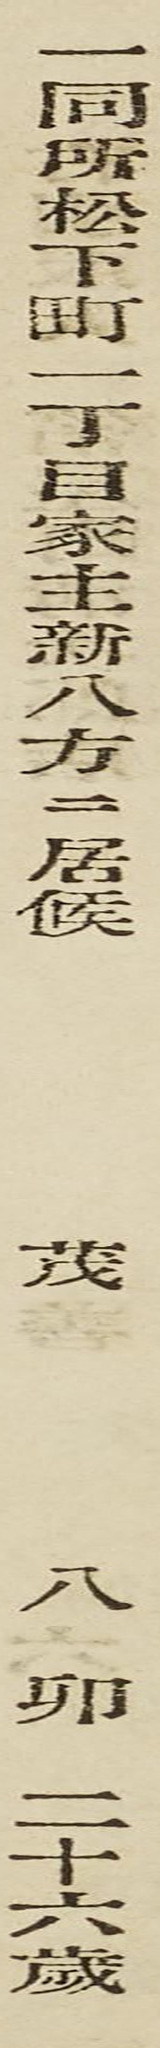一同所松下町一丁目家主新八方ニ居候茂八卯二十六歳
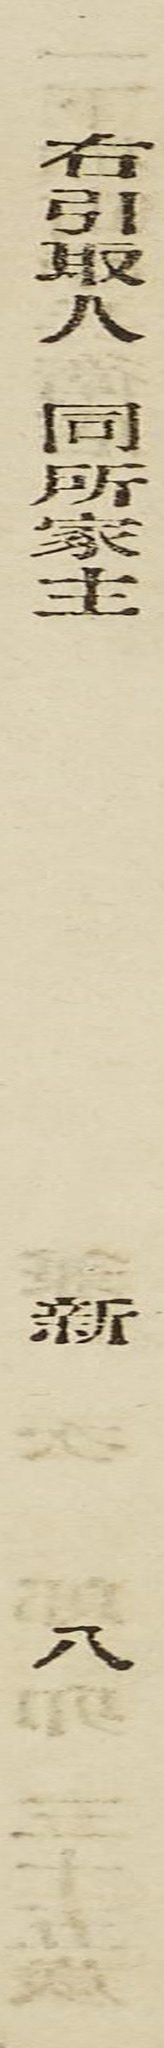右引取人同所家主新八
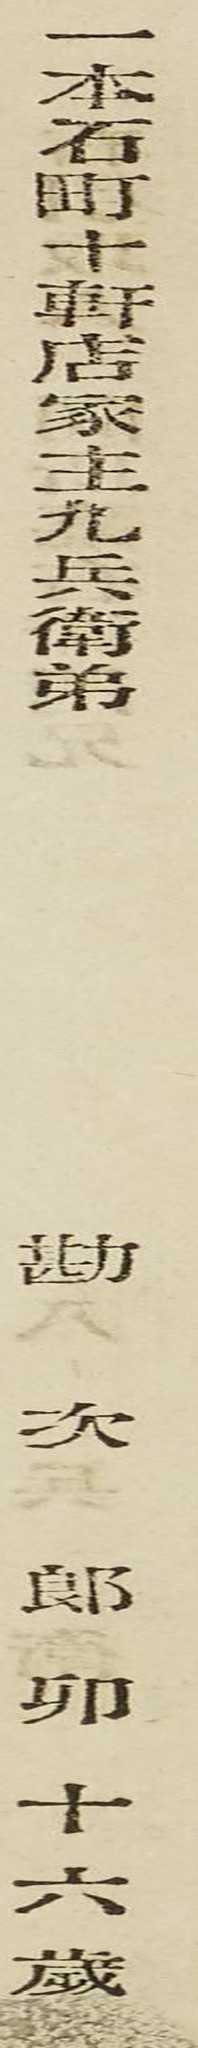一本石町十軒店家主九兵衛弟勘次郎卯十六歳
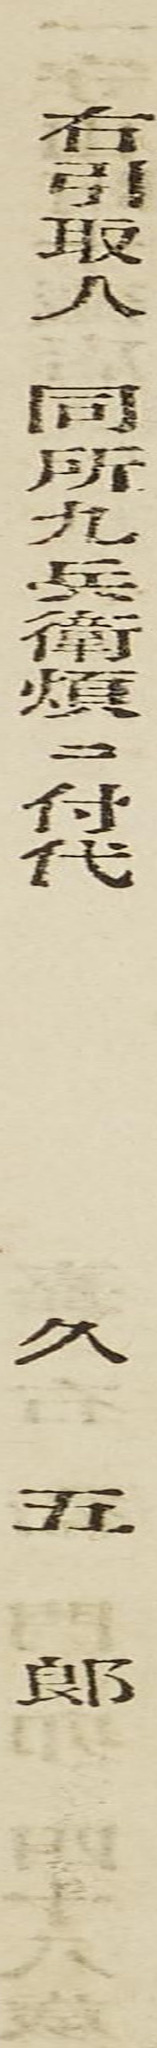右引取人同所九兵衛煩ニ付代久五郎
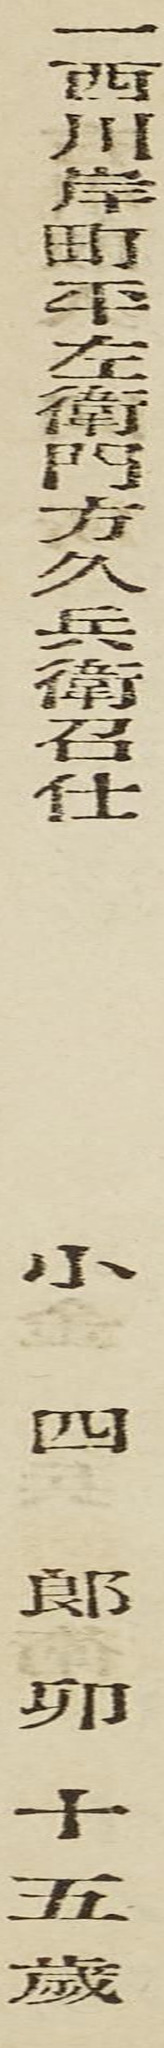一西川岸町平左衛門方久兵衛召仕小四郎卯十五歳
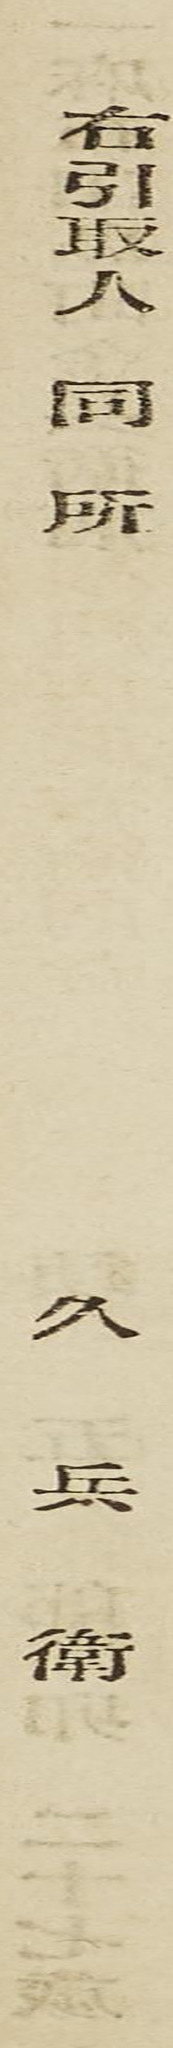右引取人同所久兵衛
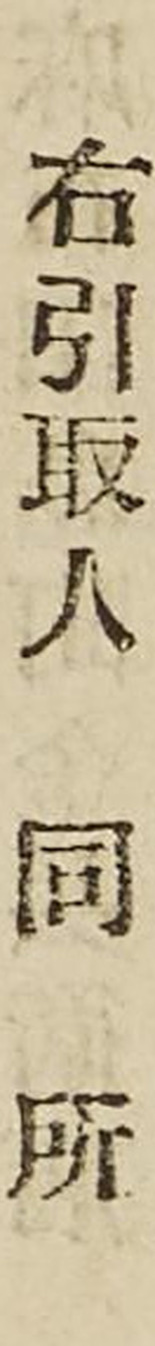右引取人同同

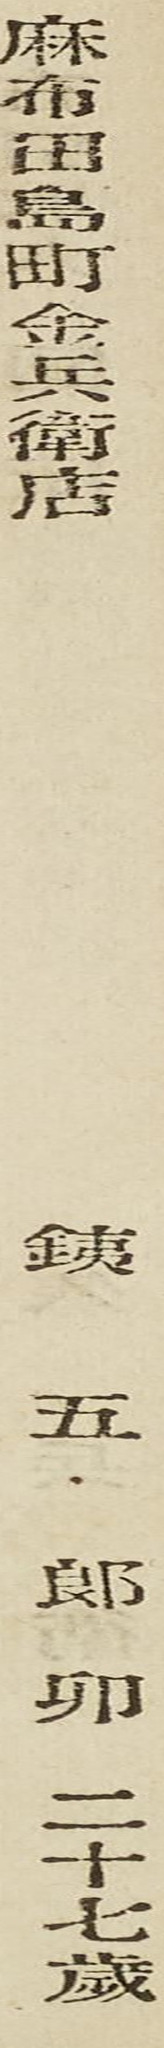一麻布田島町金兵衛店銕五郎卯二十七歳
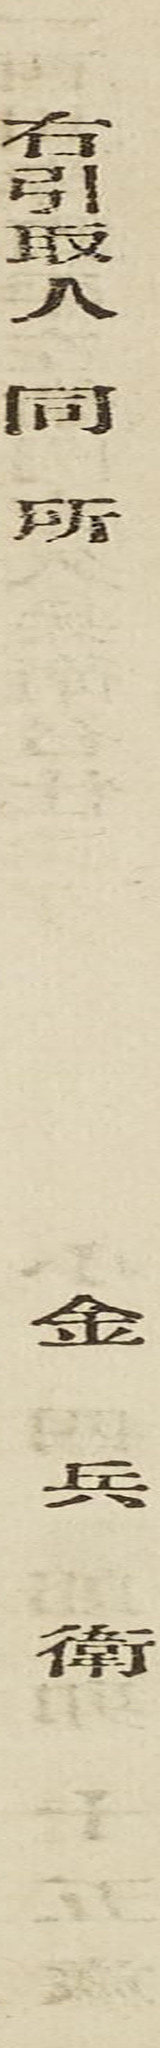右引取人同所金兵衛
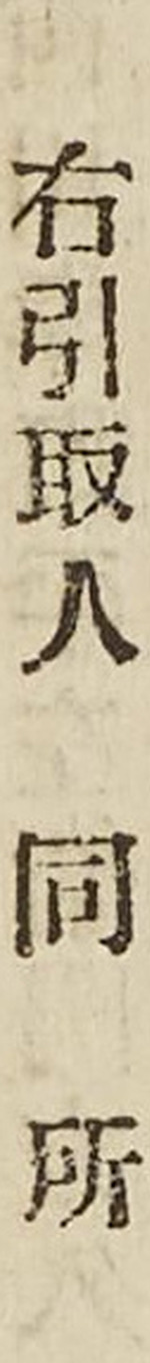右引取人同同
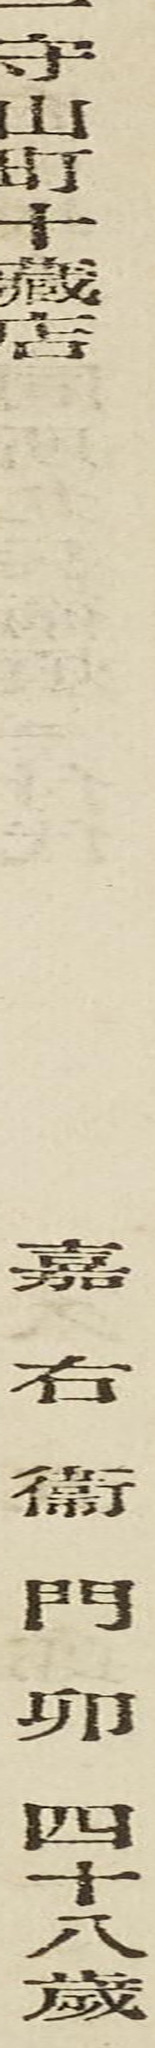一守山町十蔵店嘉右衛門卯四十八歳
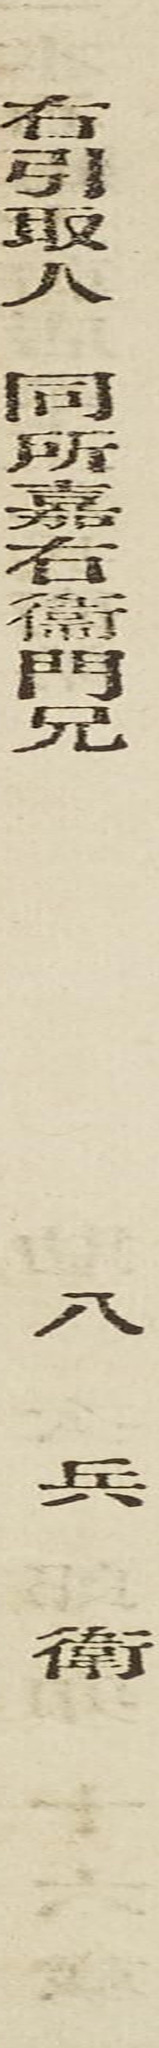右引取人同所嘉右衛門兄八兵衛
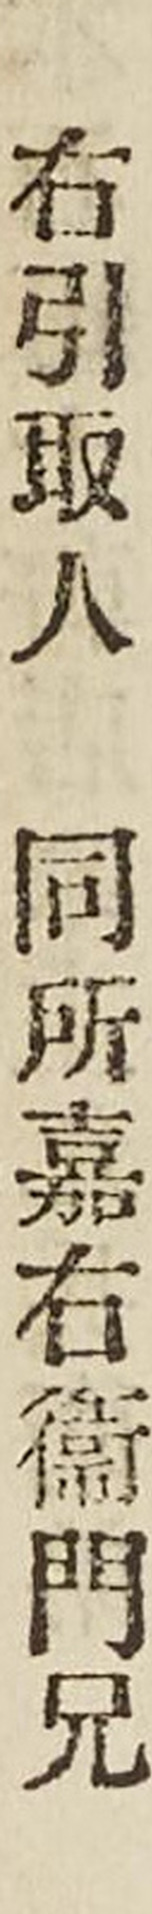右引取人同所虎右衛門
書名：永代惨話　文化の夢　全
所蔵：東京大学地震研究所図書室 Earthquake Research Institute Library, The University of Tokyo, JAPAN
